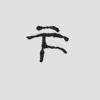下
